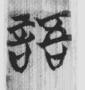語
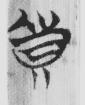貨
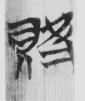資
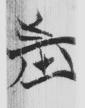市
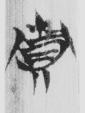賈
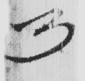乃
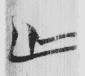亡
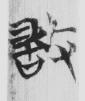敢
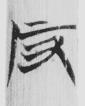反
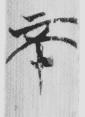不
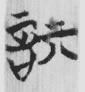{言亓}
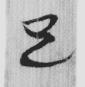巳
